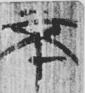不
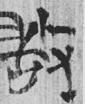敢
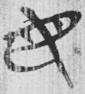母
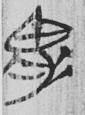{胃刀}（謂）
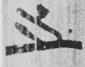之
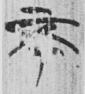不
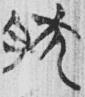○（然）
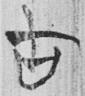古（故）
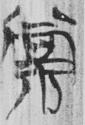○（常）
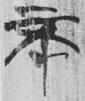不
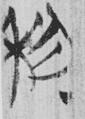利
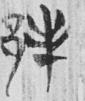邦
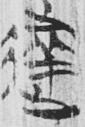○（失）
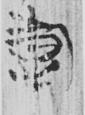○（幹）
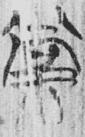○（常）
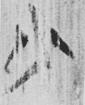少（小）
